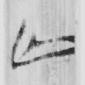亡
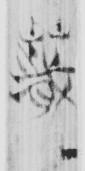{艸歲}
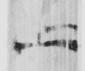上
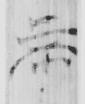不
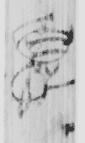𢝊
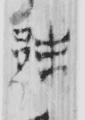邦
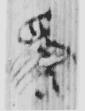{爪家}
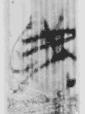𡚦
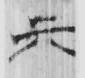亓
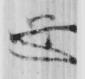正
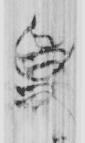事
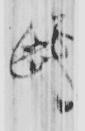臤
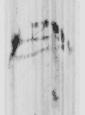甬
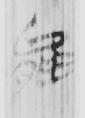能
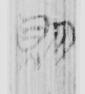則
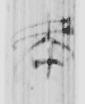民
